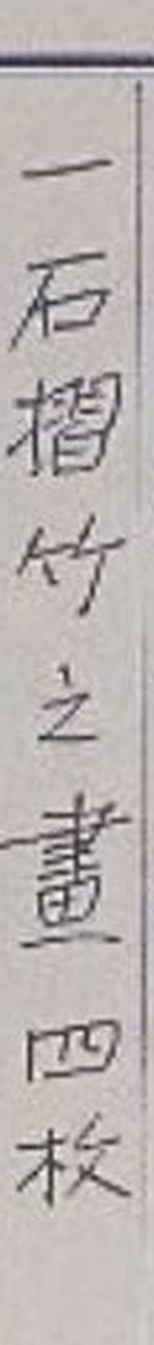一石摺竹之画四枚
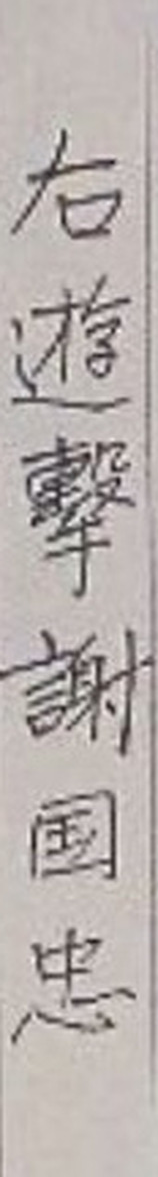右遊撃謝国忠

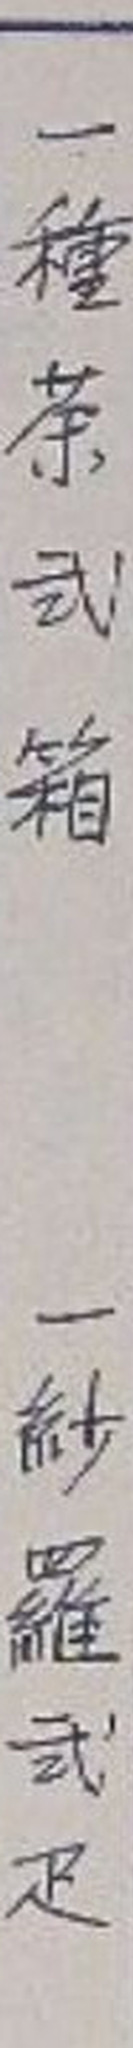一種茶弐箱一沙羅弐疋
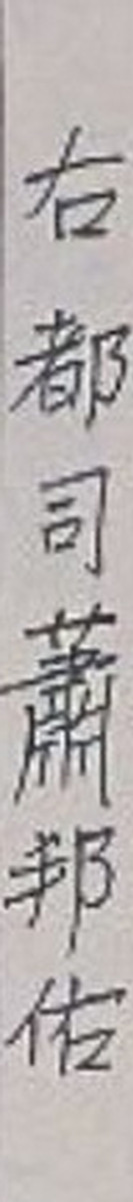右都司蕭邦佑
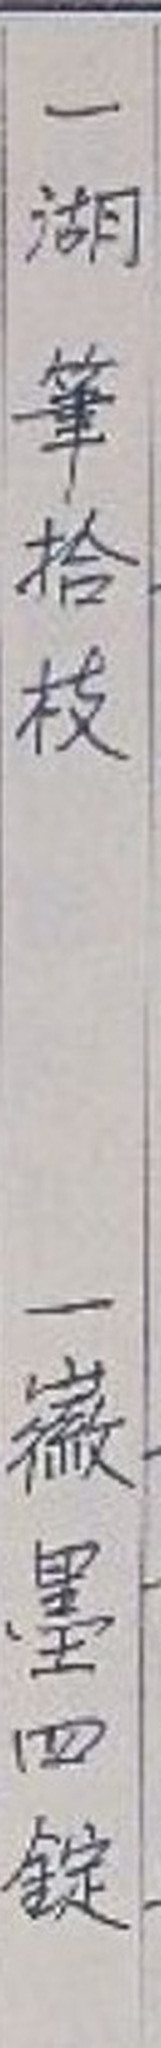一湖筆拾枝一徽墨四錠
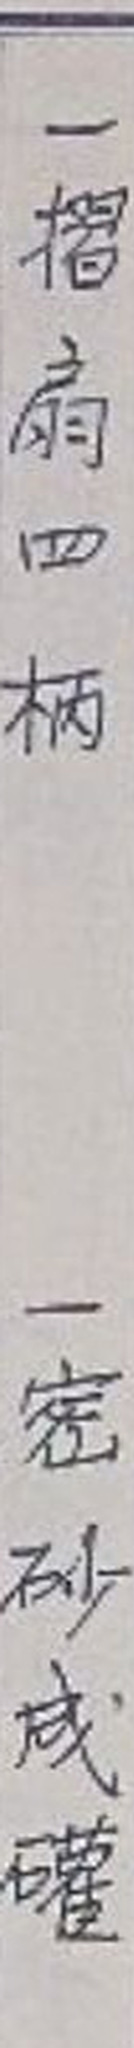一摺扇四柄一密砂成礶
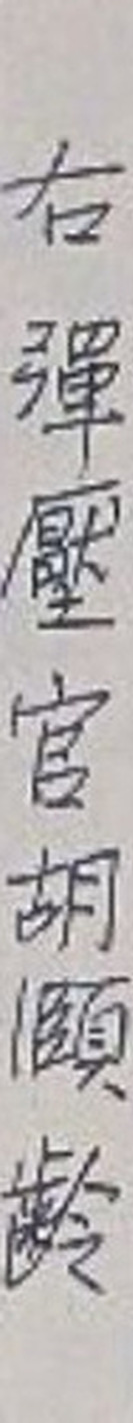右弾圧官胡頥齢
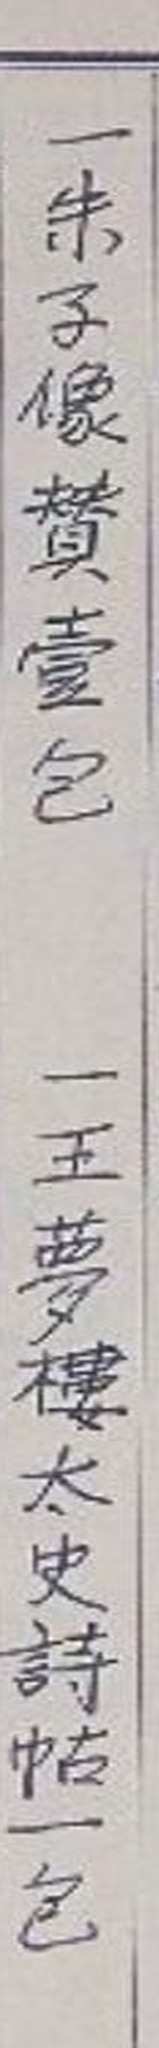一朱子像賛壱包一王夢楼太史詩帖一包
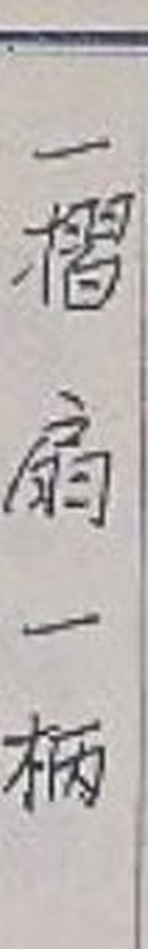一摺扇一柄一聯字一対
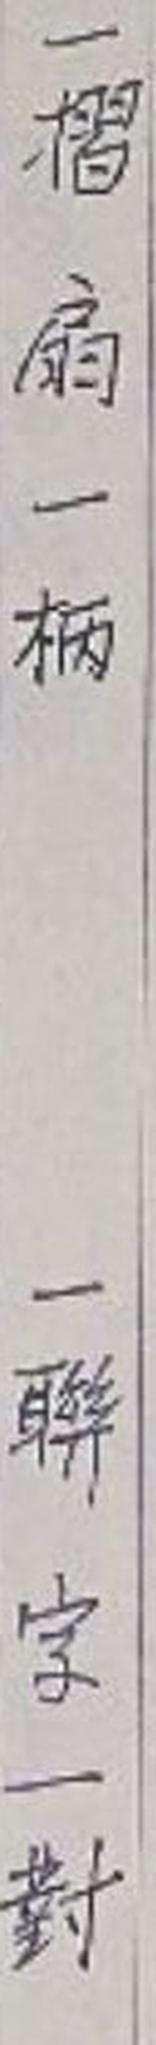一摺扇一柄一聯字一対
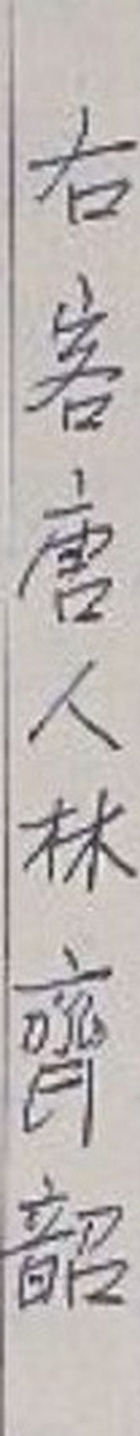右客唐人林齊韶
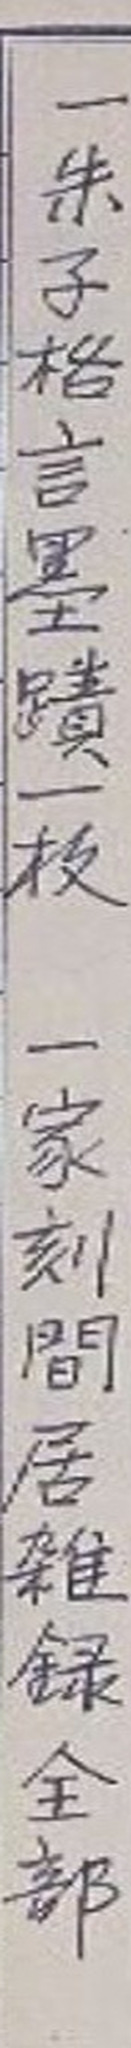一朱子格言墨蹟一枚一家刻間居雑録全部
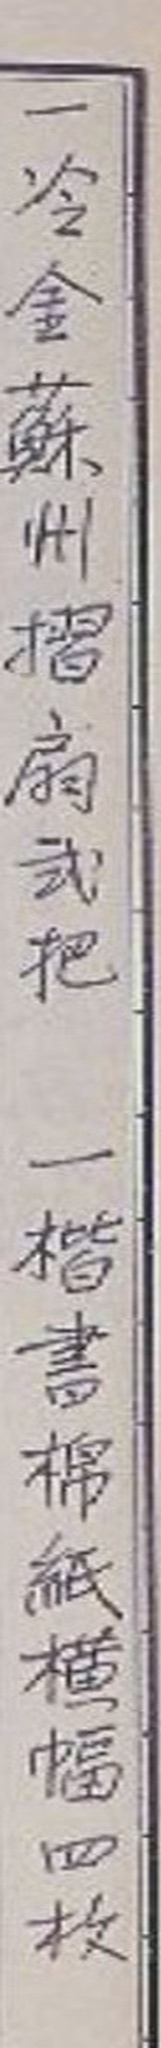一冷金蘇州摺扇弐把一楷書棉紙横幅四枚
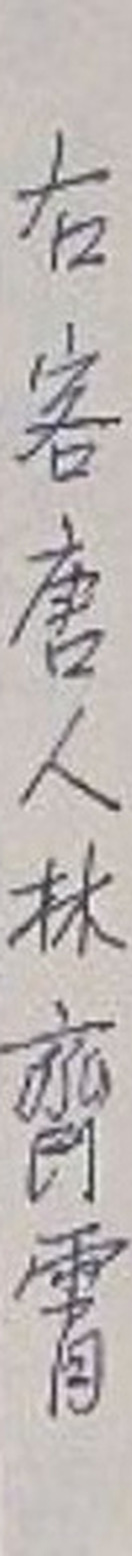右客唐人林齊韶
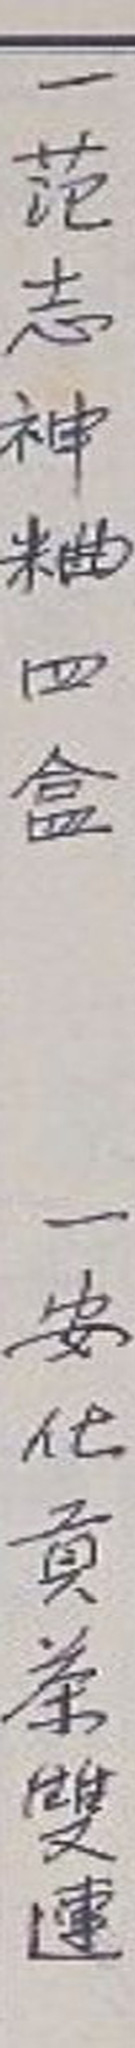一范志神粡四盒一安化貢茶雙連
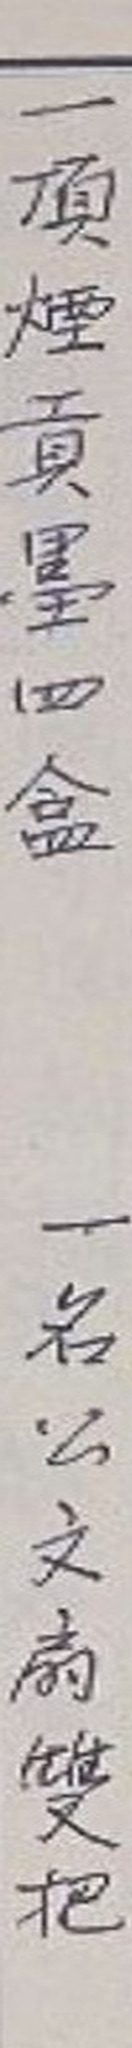一頂煙貢墨四盒一名公文扇雙把
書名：支那冊封使来琉諸記 下巻
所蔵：University of the Ryukyus Library
